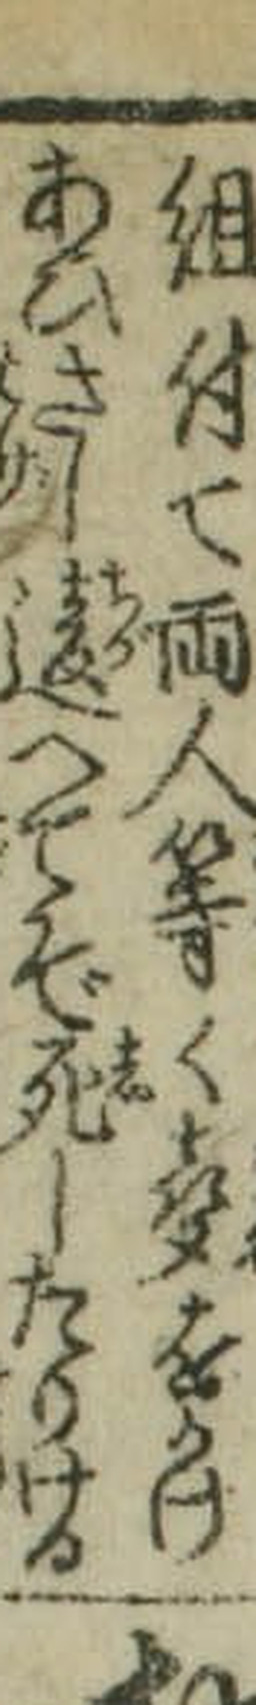あひさし違へてぞ死したりける
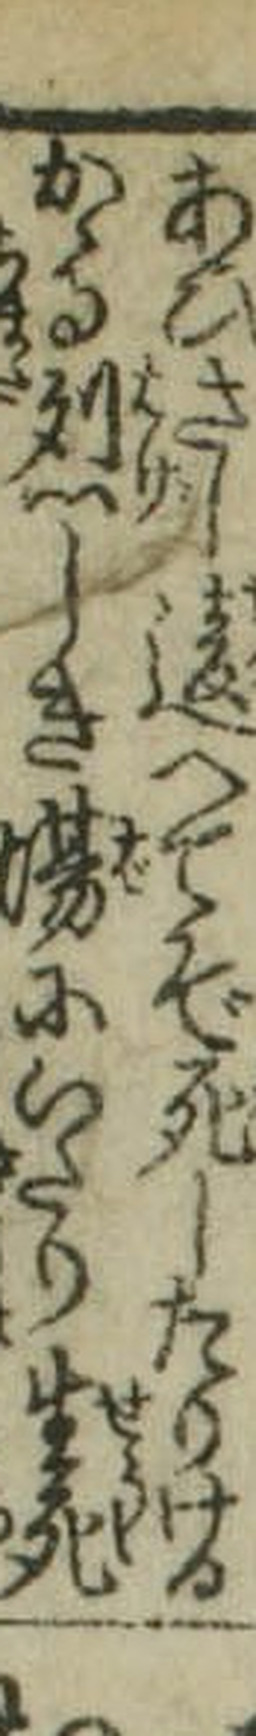かゝる烈しき場にいたり生死
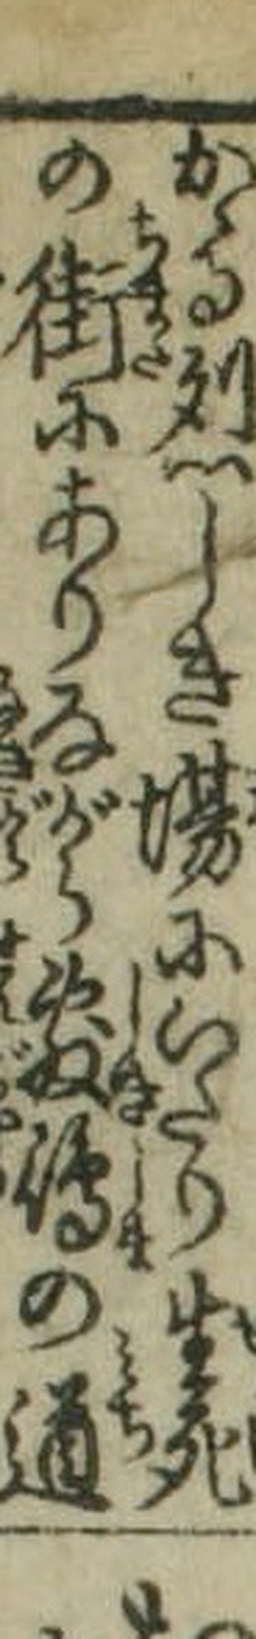の街にありながら敷嶋の道
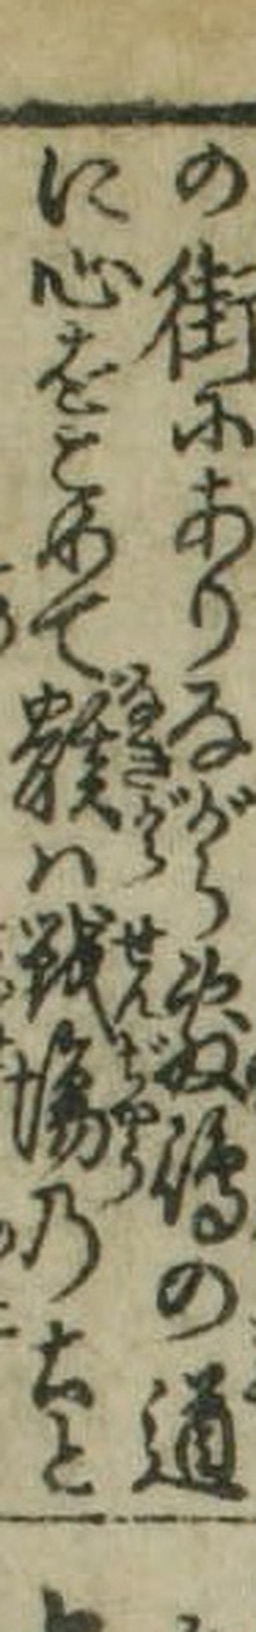に心をこめて骸は戦場の土と
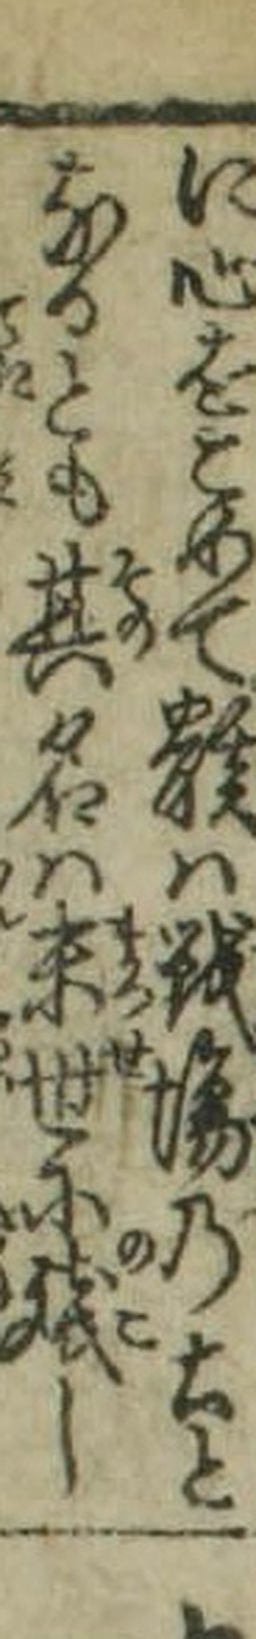なるとも其名は末世に残し
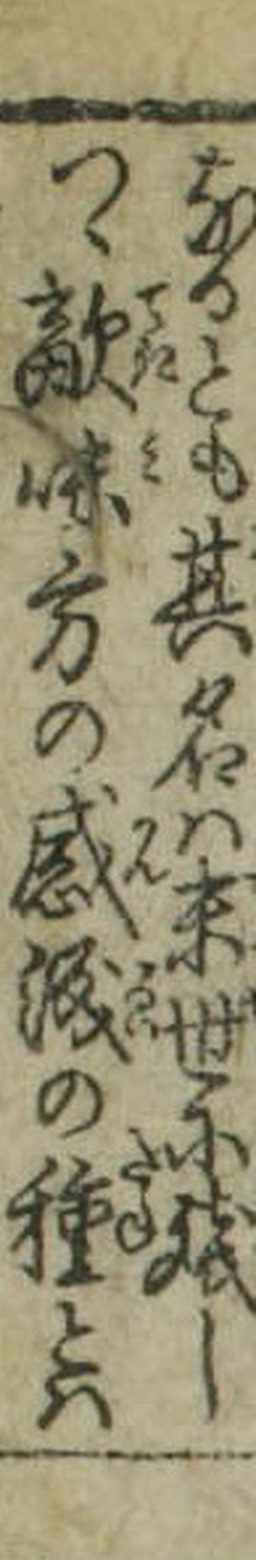つゝ敵味方の感涙の種とは
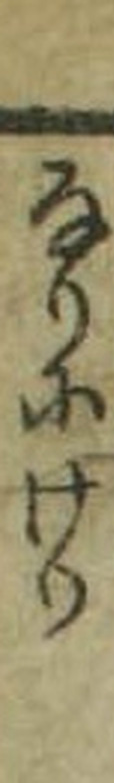なりにけり
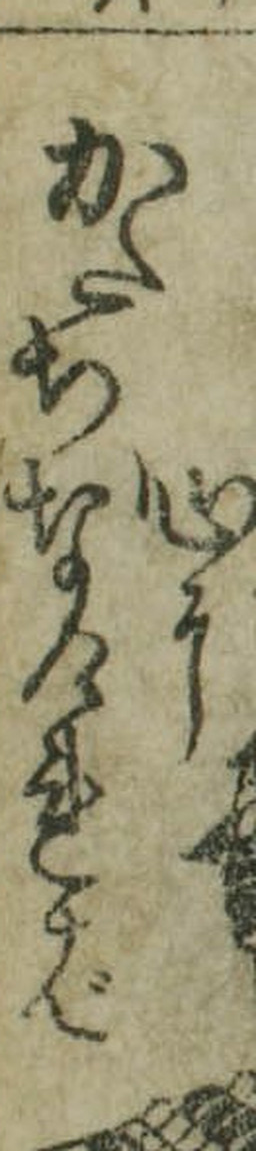かたちなければ

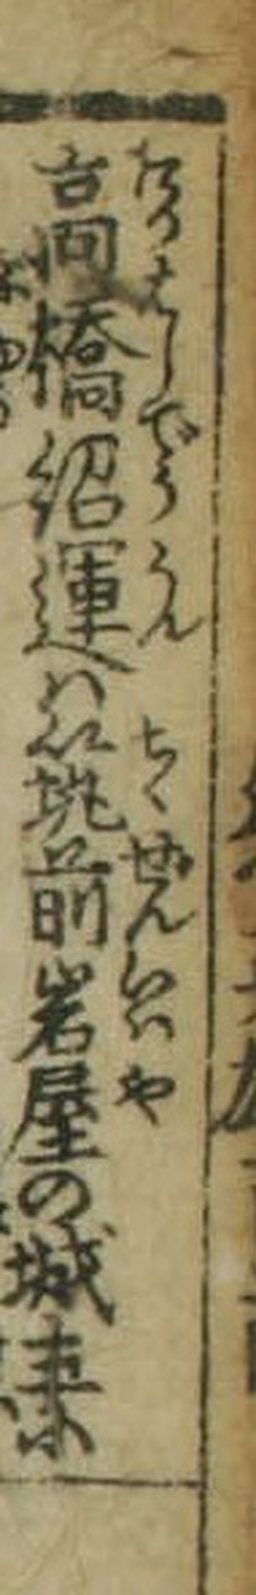高橋紹運は筑前岩屋の城主に
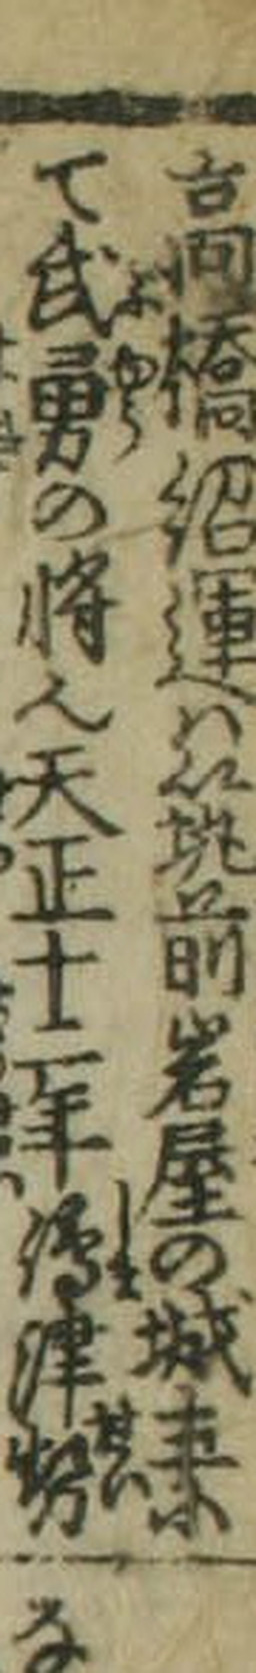て武勇の将也天正十二年嶋津勢
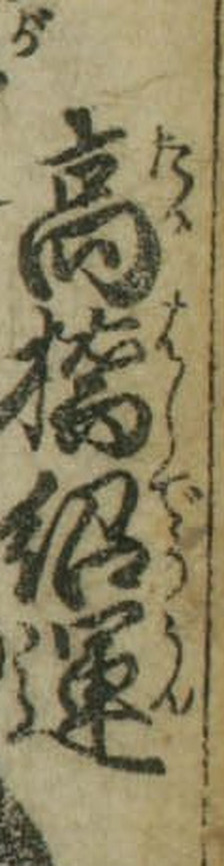高橋紹運
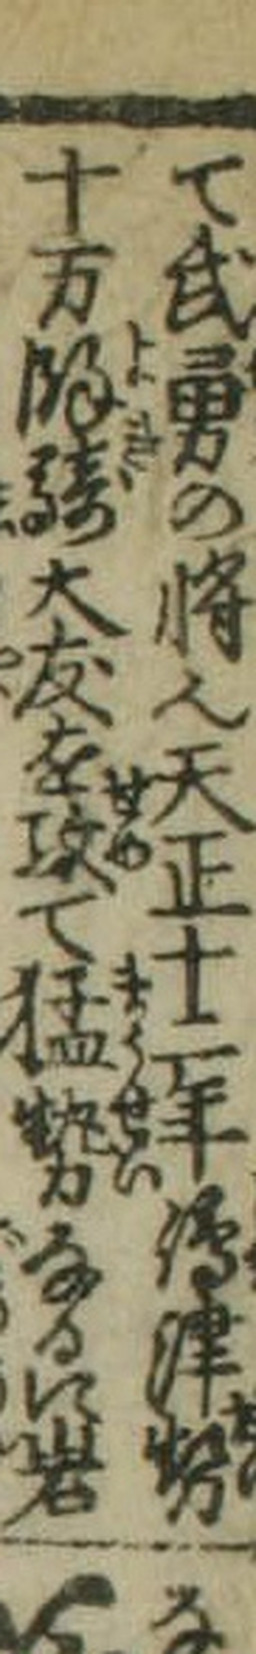十万余騎大友を攻て猛勢なるに岩
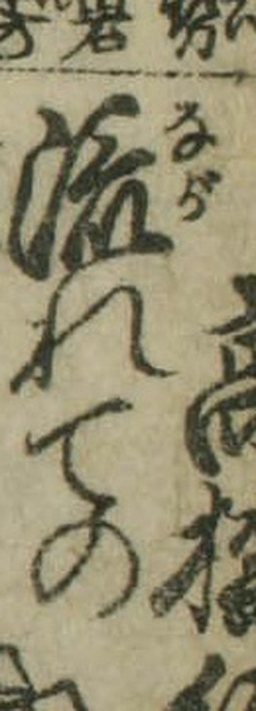流れての
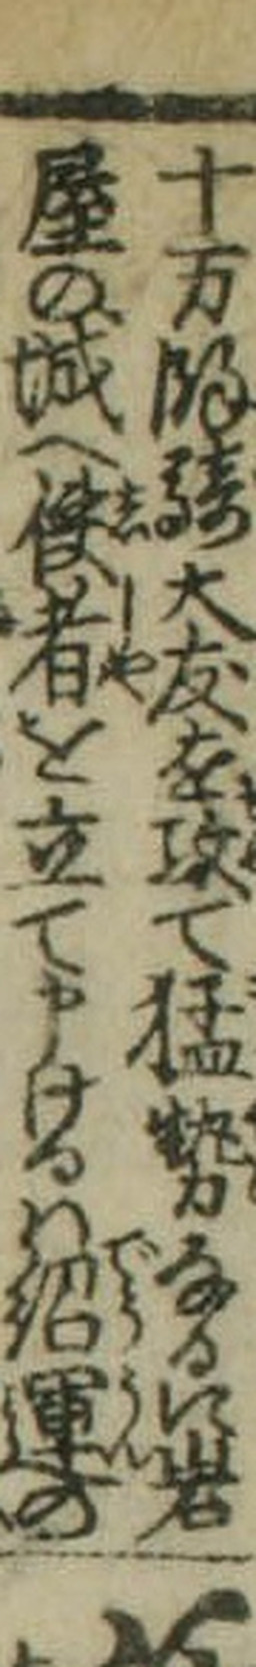屋の城へ使者を立て申けるは紹運の
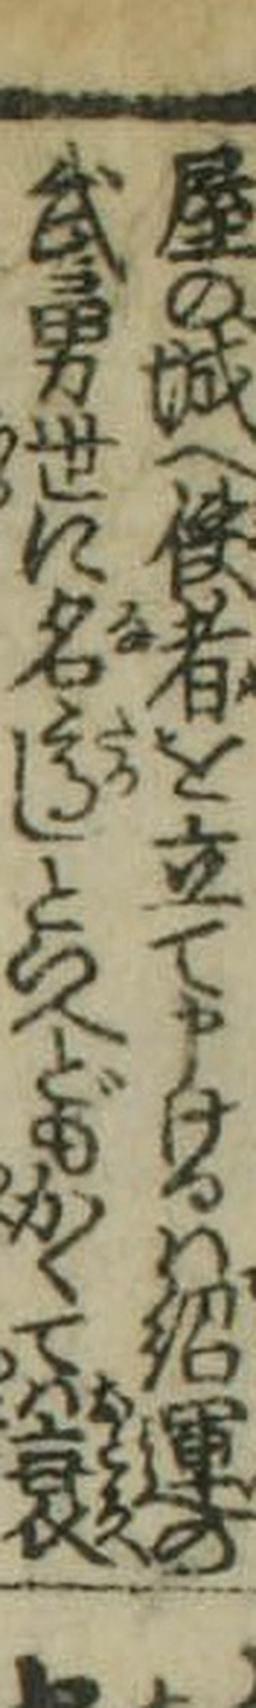武勇世に名高しといへどもかくては衰
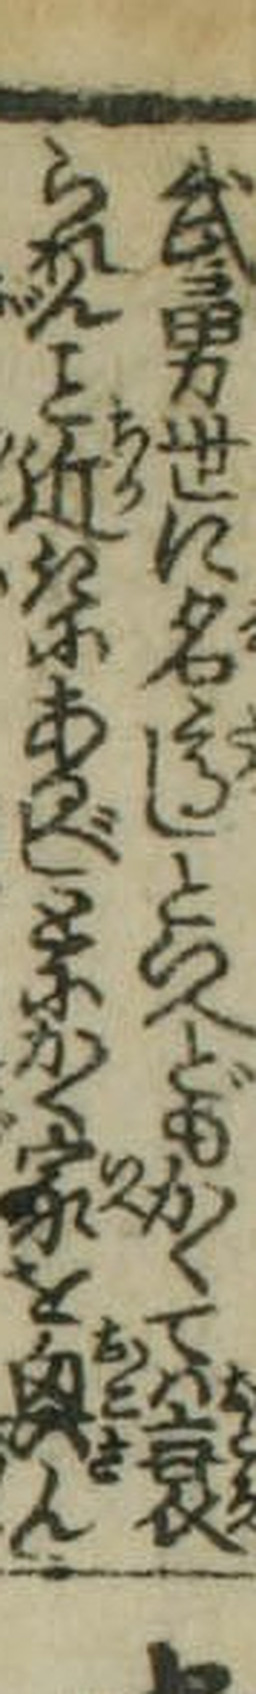られんこと近きにあるべしとにかく家を興ん
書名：續英雄百人一首
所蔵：東京学芸大学附属図書館
